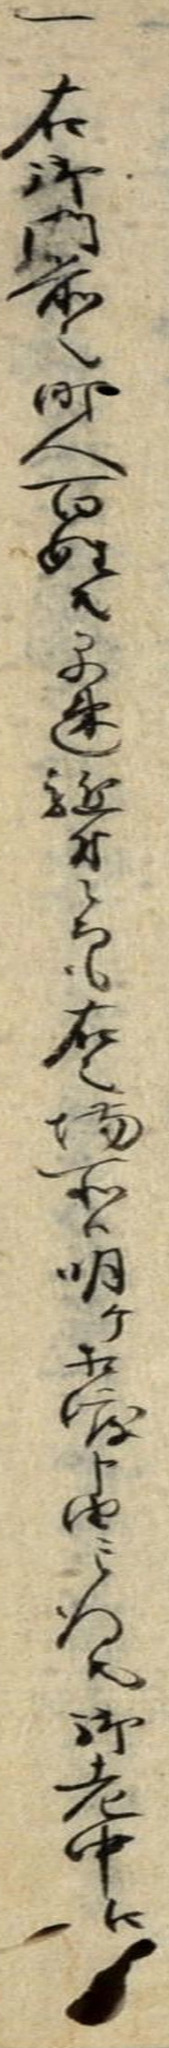一右御門前之町人百姓共早速駆付候ても右之場所は明け相渡申由に候得共御老中江

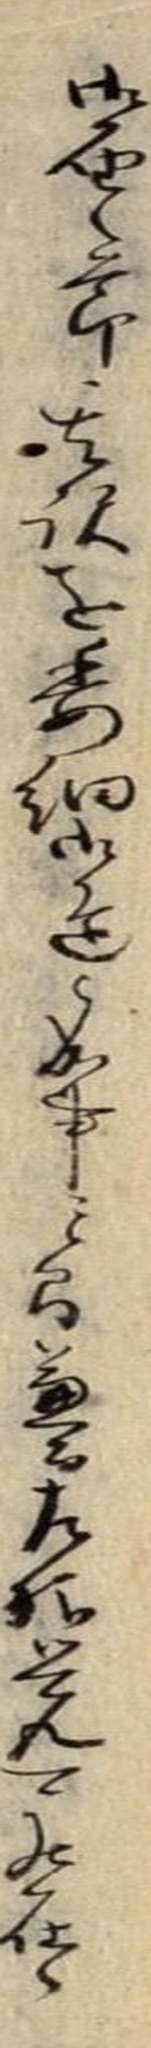御届之節其訳を委細御達被成事に候間兼て左様覚可罷在候
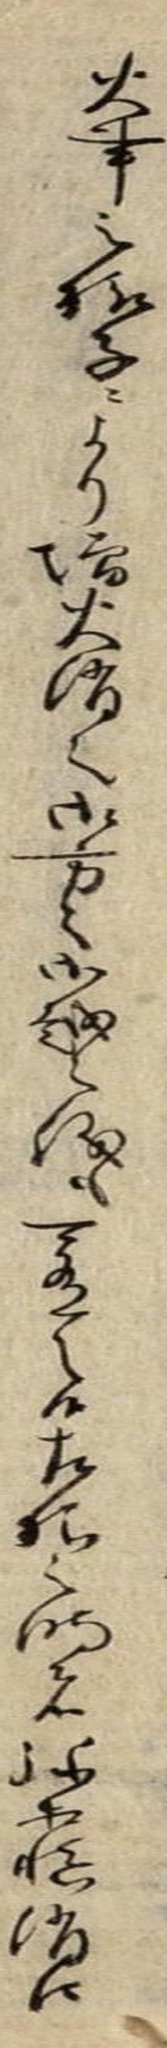一火事之様子により増火消之御方々御越之儀も可有之候左様之時は弥相慎消口
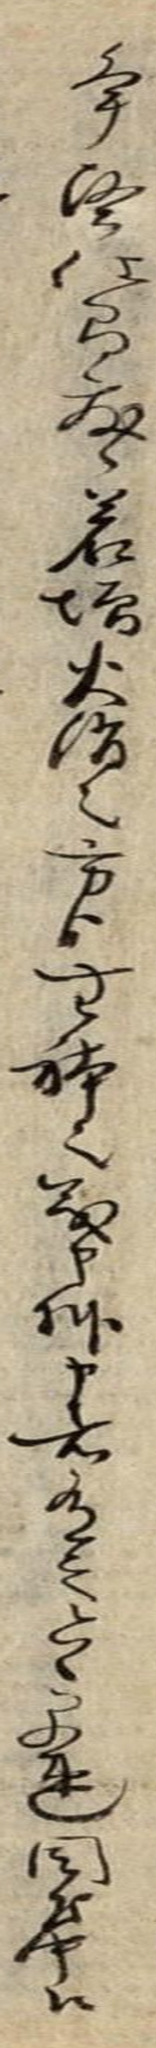争堅仕間敷候若増火消之方ゟ無体之義申掛申者有之候はゝ早速目付中江
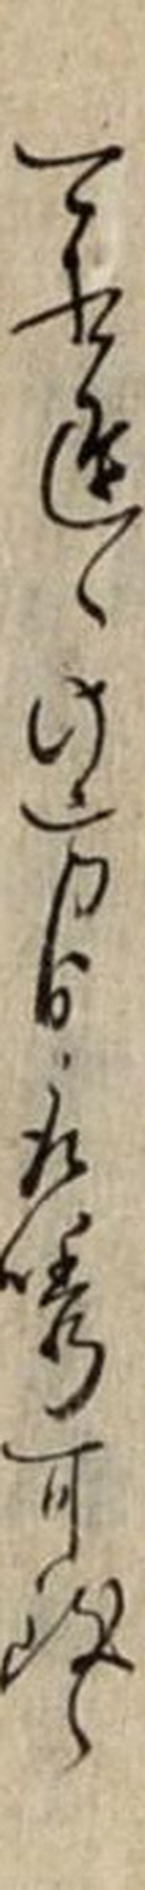可相達候此方ゟ唀可致候
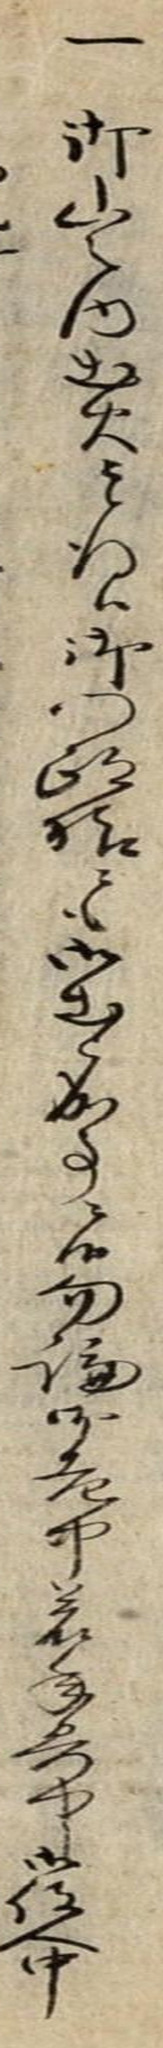一御山之内出火に候得は御門跡様にも御出被成事に候勿論御老中若年寄中御役人中
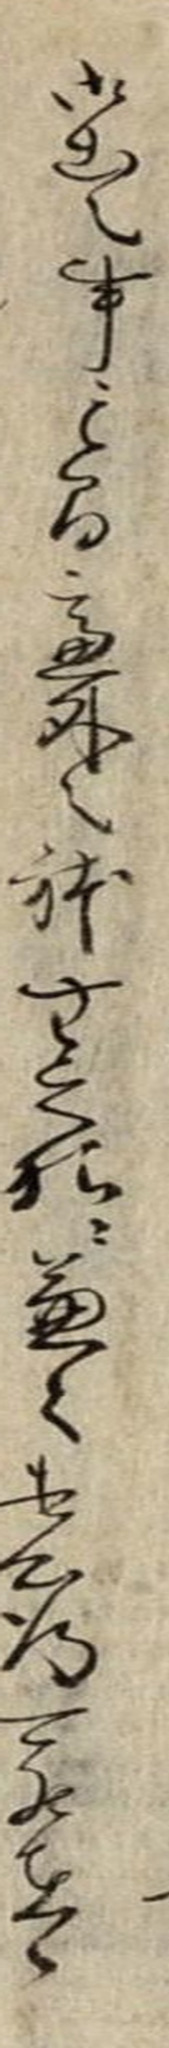御出之事に候間慮外之体無之様に兼々相心得可罷在候
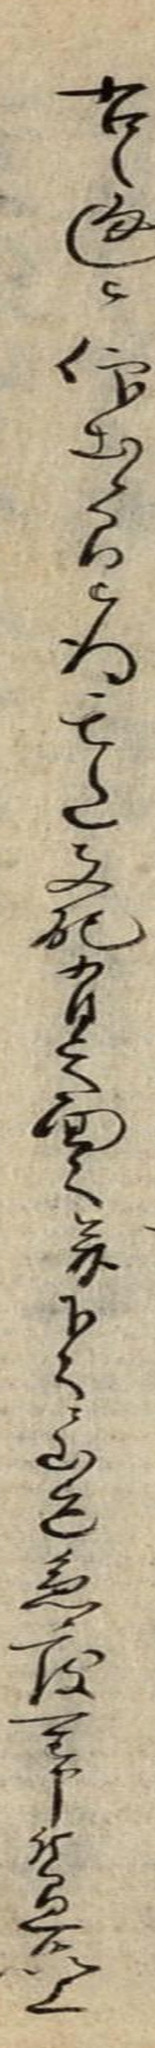右之通被仰出候間被得其意支配有之面々并下々に至迄急度可被申付置候以上
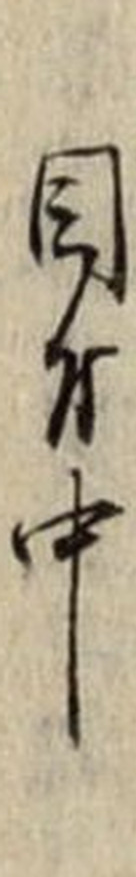目付中
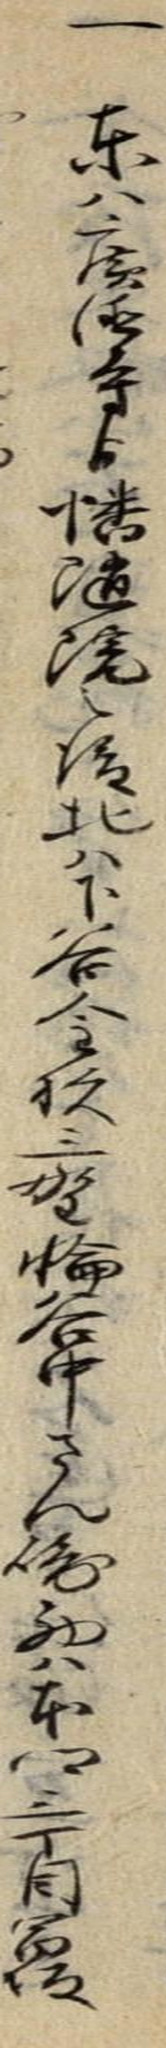一東は広徳寺ゟ幡随院之後北は下谷金杉三野輪谷中さん崎西は本郷三丁目富坂
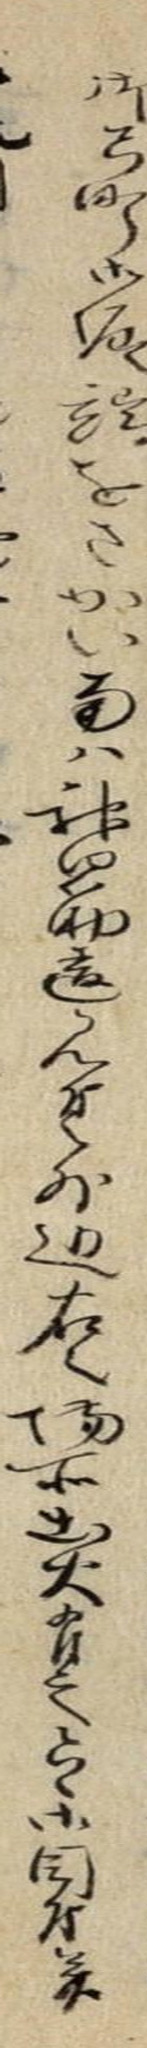御弓町御堀端をさかい南は神田筋違見付之外辺右之場所出火有之候はゝ御目付并
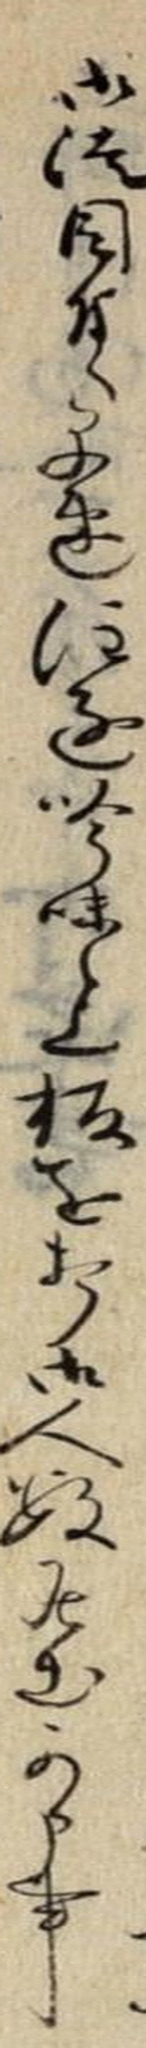御徒目付へ早速注進吟味之上板を打御人数罷出可申事
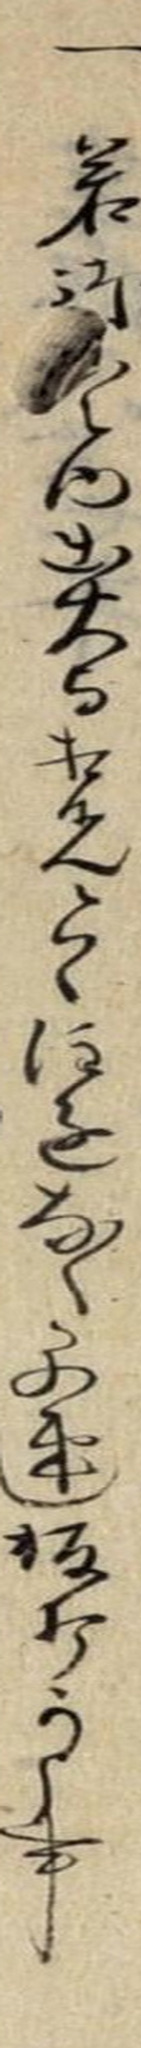一若御門之内出火と相見候はゝ注進なく早速板打可申事
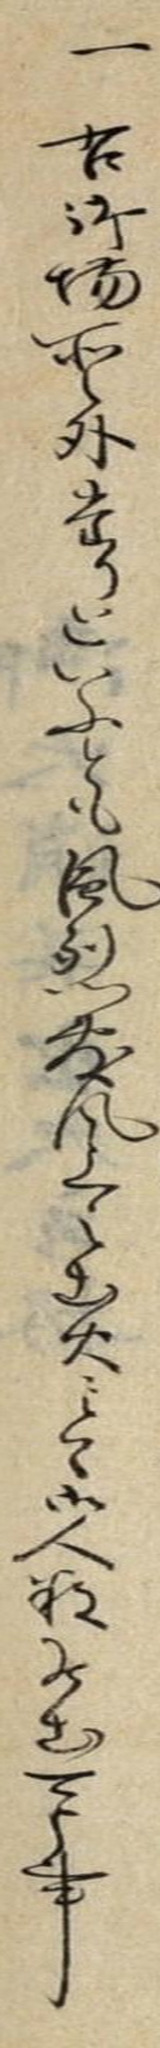一右御場所之外たりといふとも風烈敷風上之出火に候はゝ御人数罷出可申事
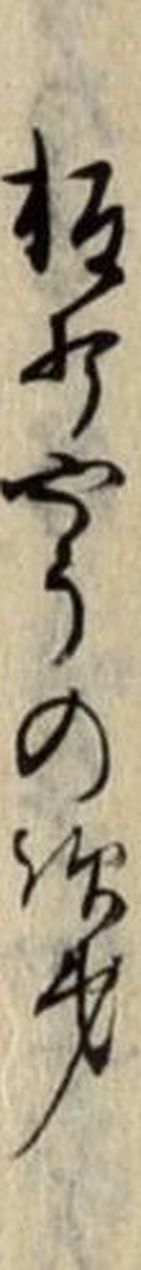板打やうの次第
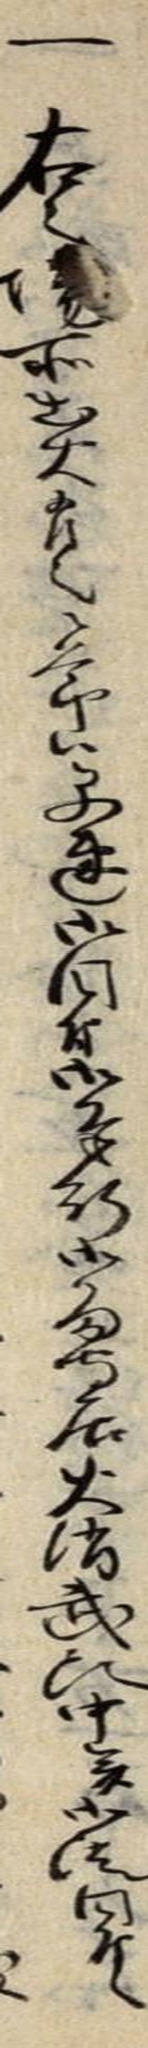一右之場所出火有之候節は早速御目付御奉行御留守居火消武頭中并御徒目付へ
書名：三都并道中之部
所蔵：福井県文書館 Fukui Prefectural Archives
